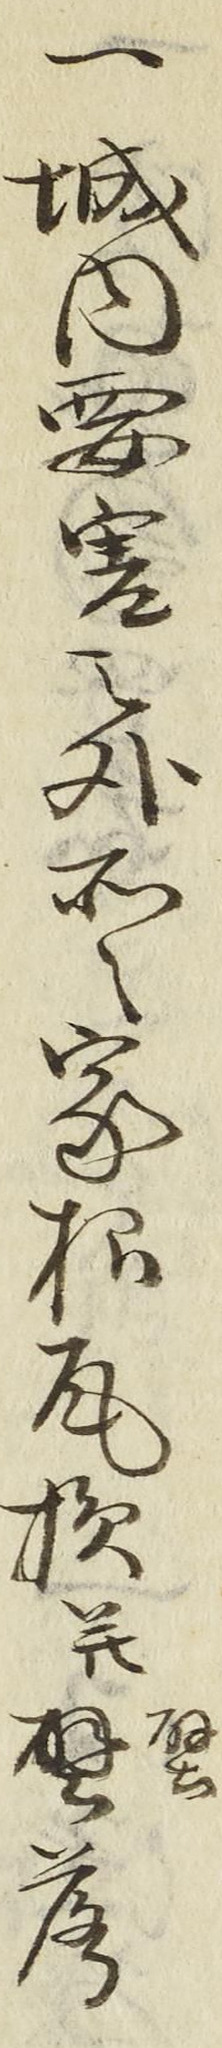一城内要塞之外所々家根瓦損并壁落
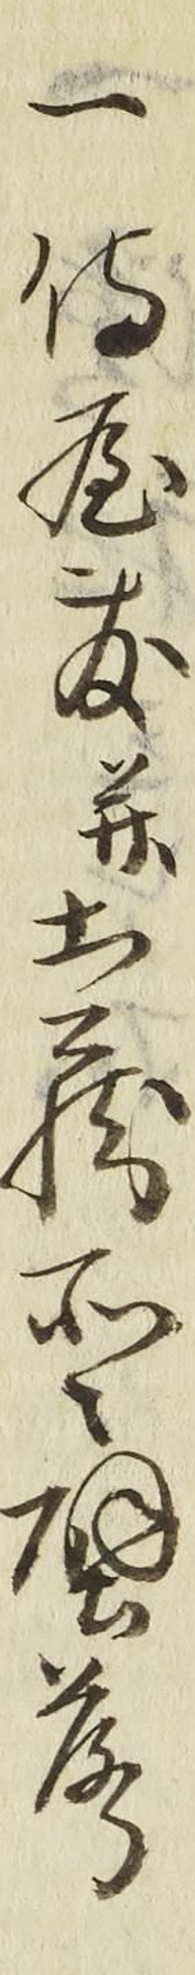一侍屋敷并土蔵所々壁落
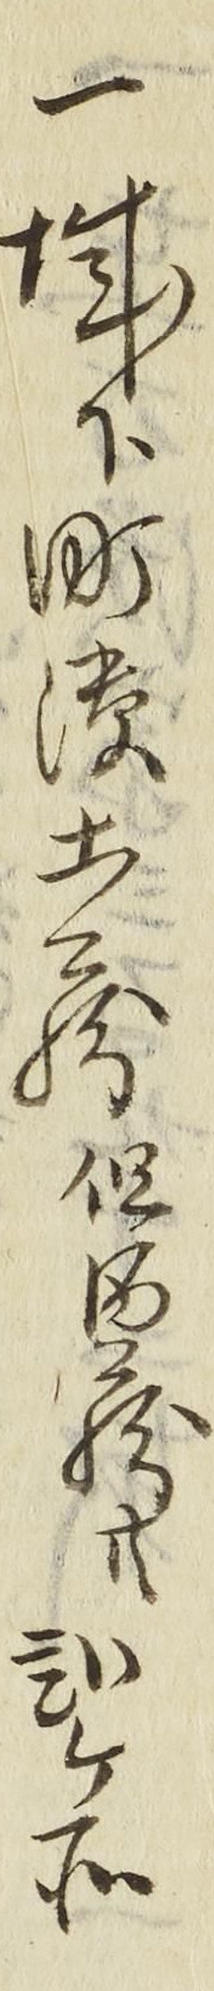一城下町潰土蔵但酒蔵共弐ヶ所
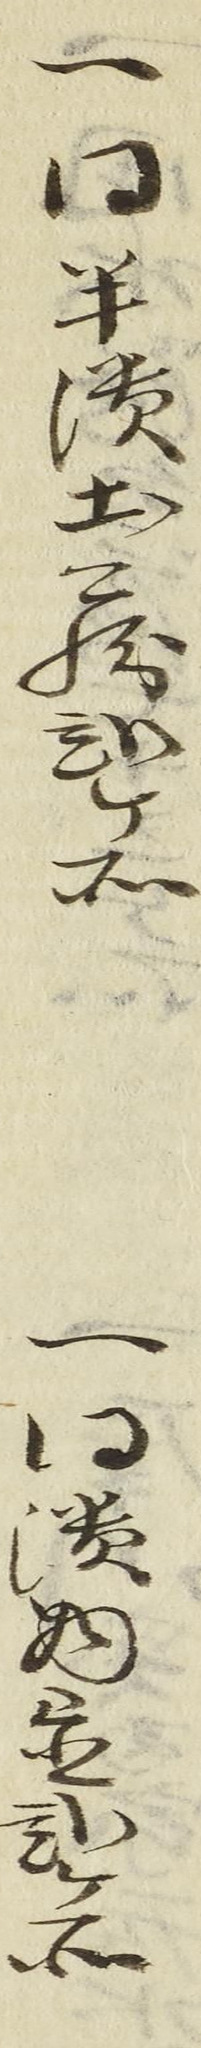一同半潰土蔵弐ヶ所一同潰物置弐ヶ所
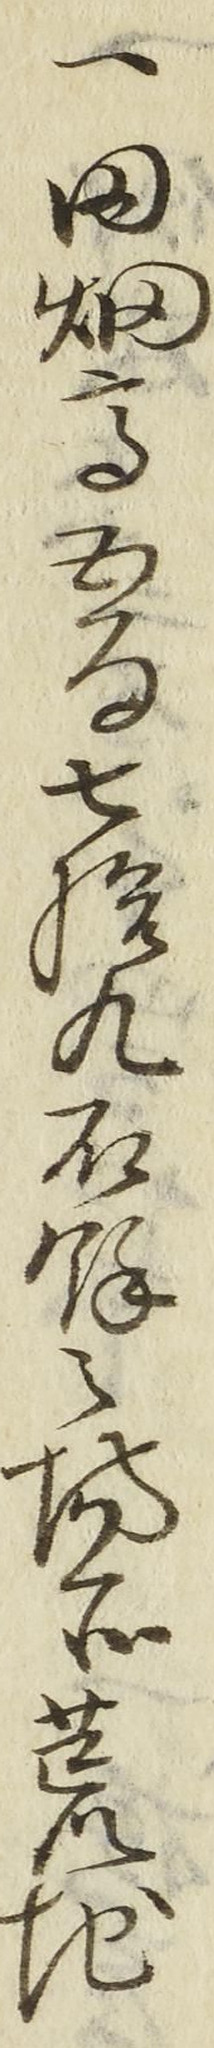一田畑高五百七拾九石餘之場所荒地
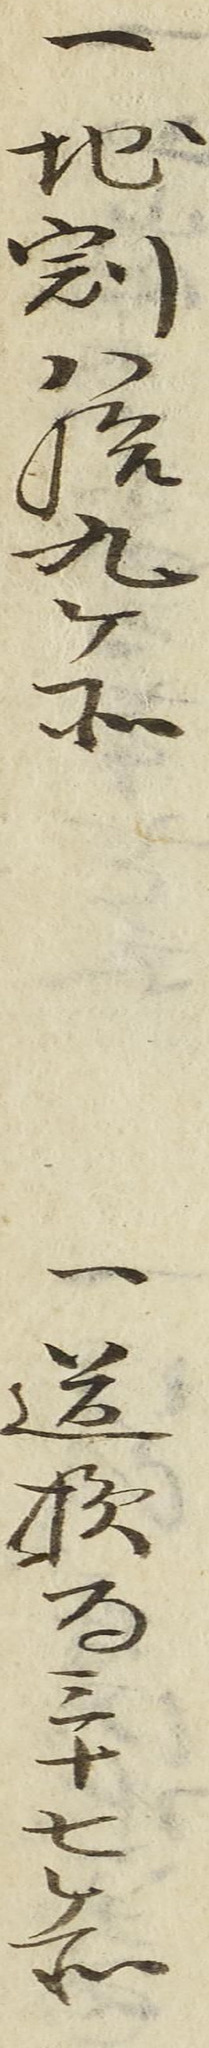一地割八拾九ヶ所一道損百三十七ヶ所
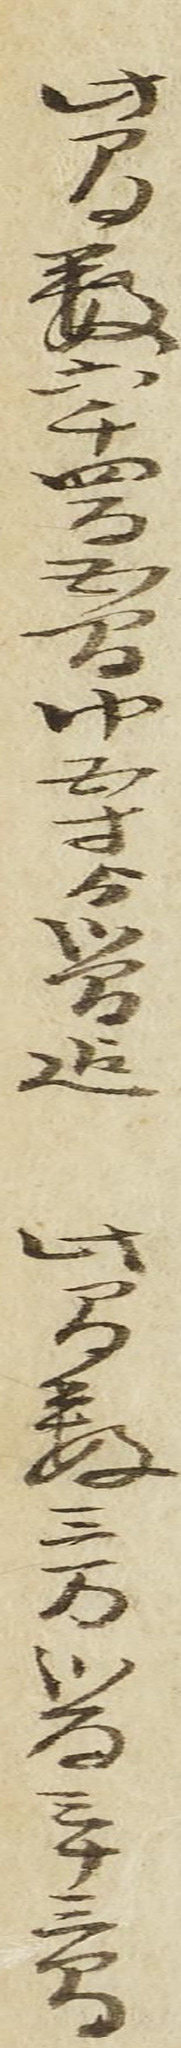此間数六千四百五間巾五寸ゟ弐間迄此間数三万弐百三十三間

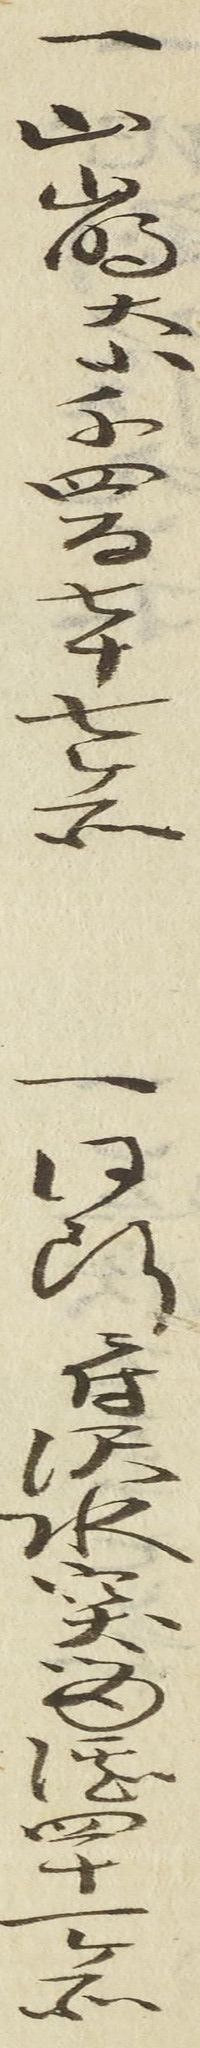一山崩大小千四百七十七ヶ所一同断二付沢水突留湛四十一ヶ所
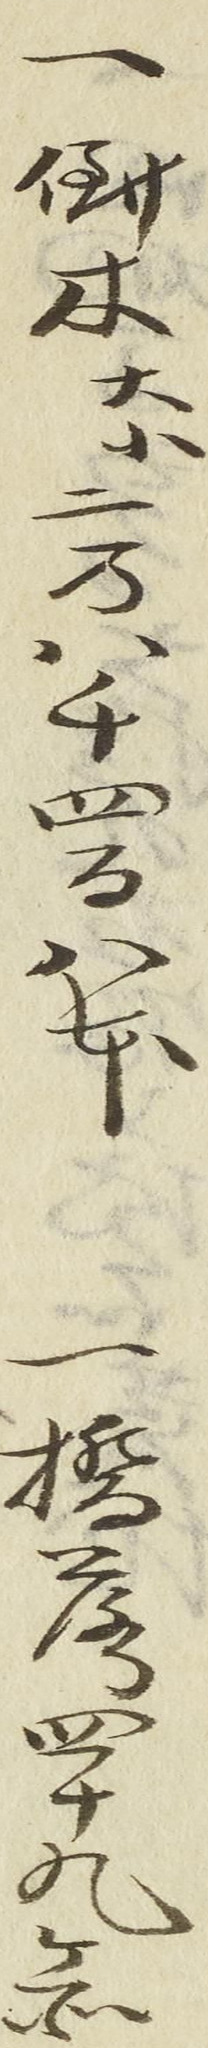一倒木大小二万八千四百八本一橋落四十九ヶ所
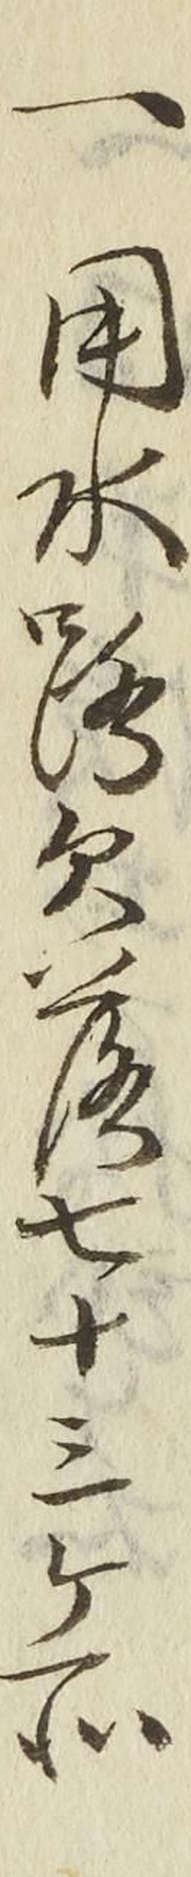一用水路欠落七三ヶ所
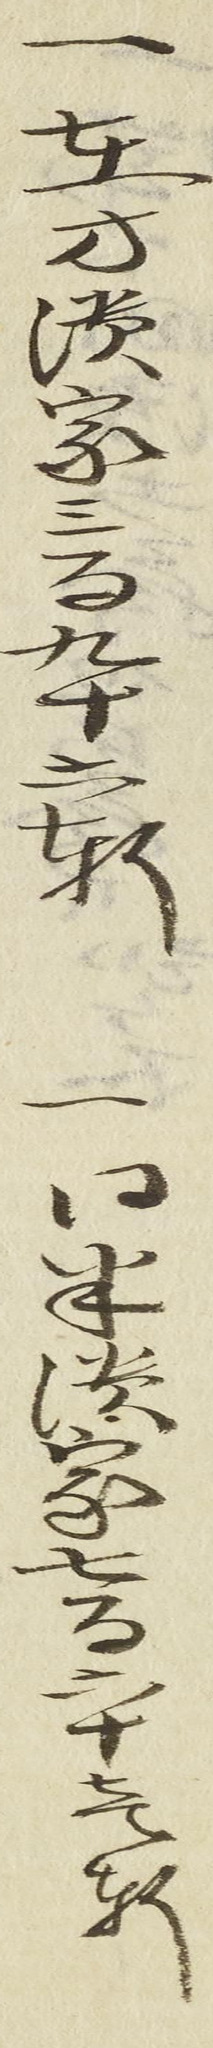一在方潰家三百九十六軒一同半潰家七百六十壱軒
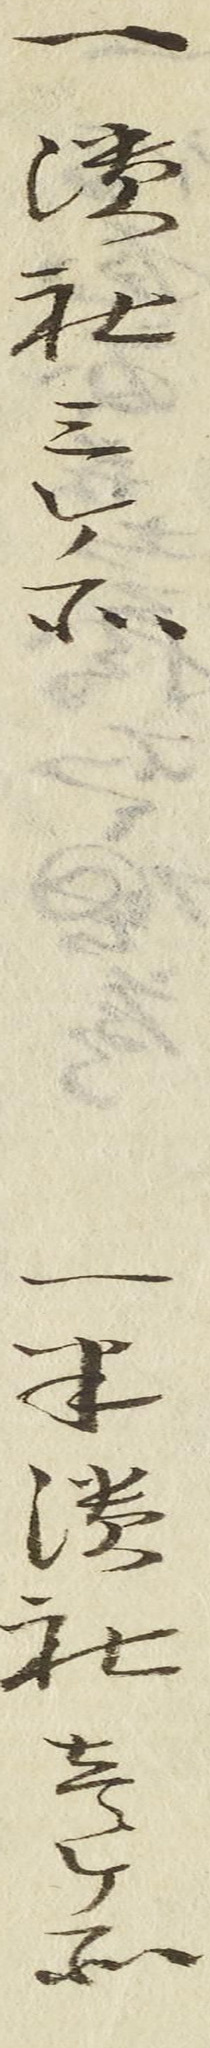一潰社三ヶ所一半潰社壱ヶ所
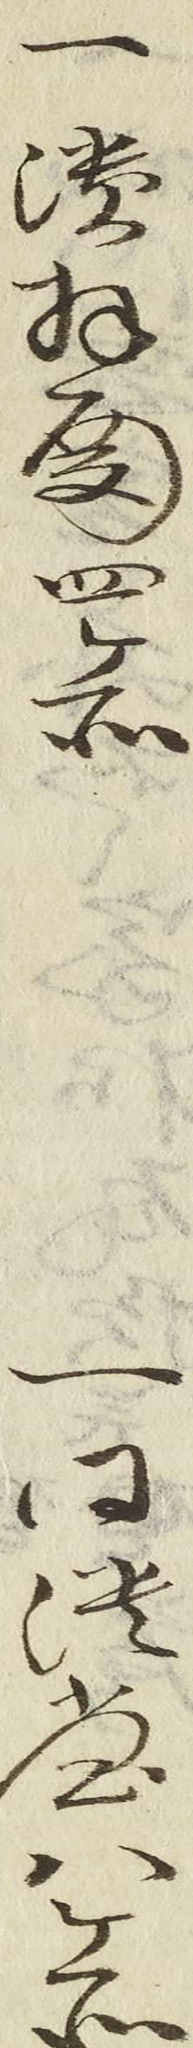一潰拝殿四ヶ所一同潰堂八ヶ所
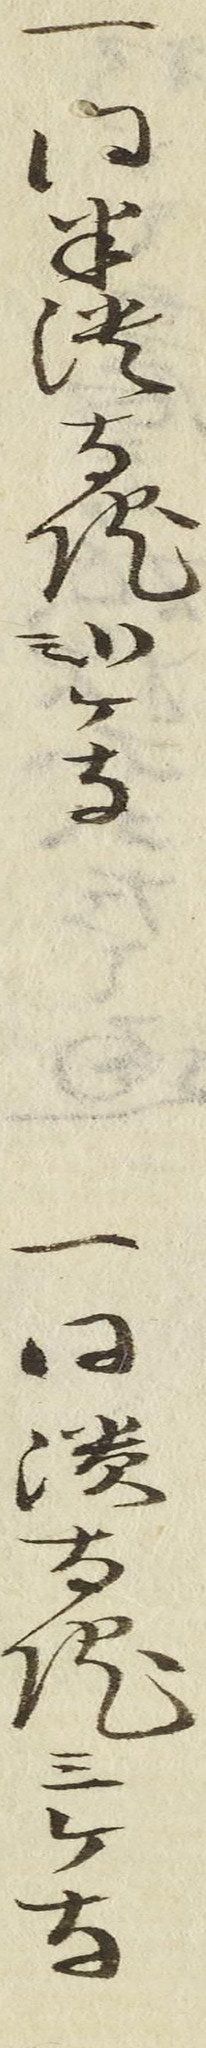一同半潰寺院弐ヶ所一同潰寺院三ヶ寺
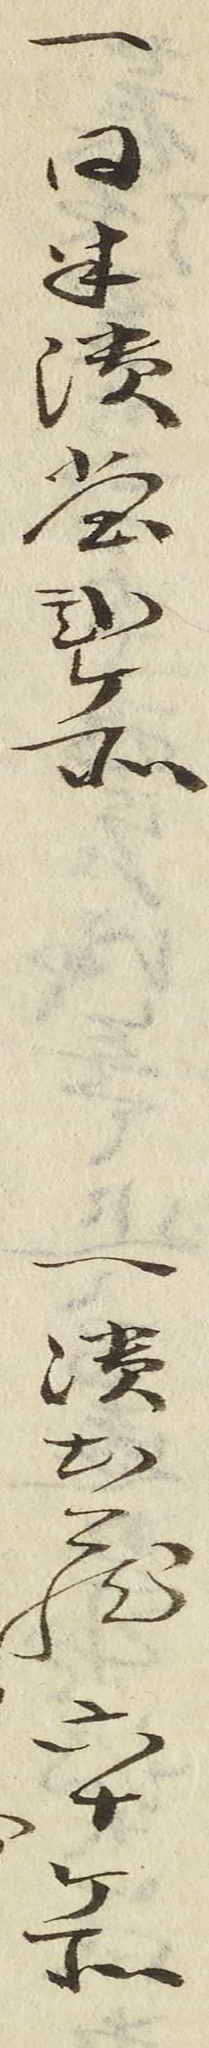一同半潰堂弐ヶ所一潰土蔵六十ヶ所
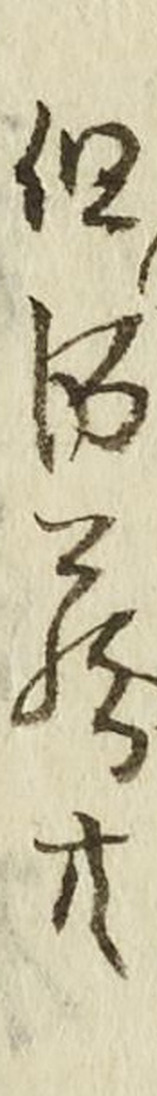但御蔵共
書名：信濃國大地震記　乾
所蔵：東京大学地震研究所図書室 Earthquake Research Institute Library, The University of Tokyo, JAPAN
